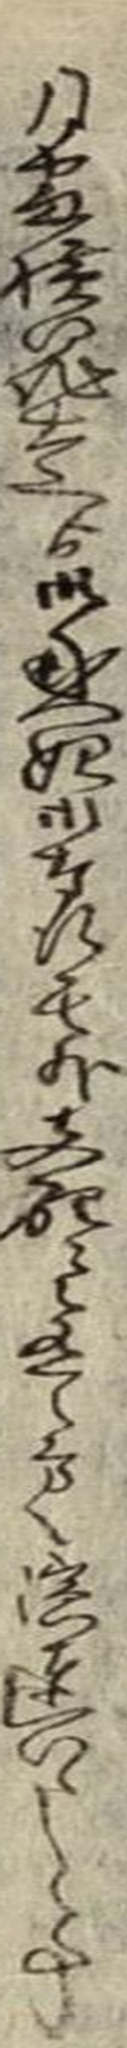月番横田作太夫ゟ御御用人始御奉行其外支配〳〵有之方へ演達いたし候事
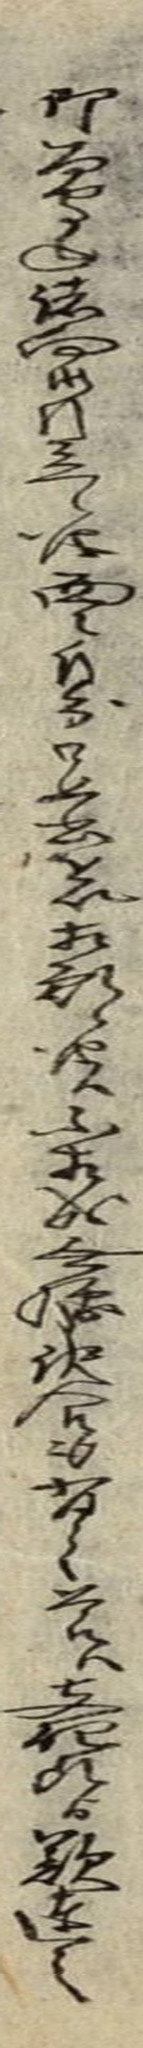御留守年諸向御引立之儀面々自分口上書を以相願候儀は不相成無拠訳合も有之候節は支配頭ゟ歎達之
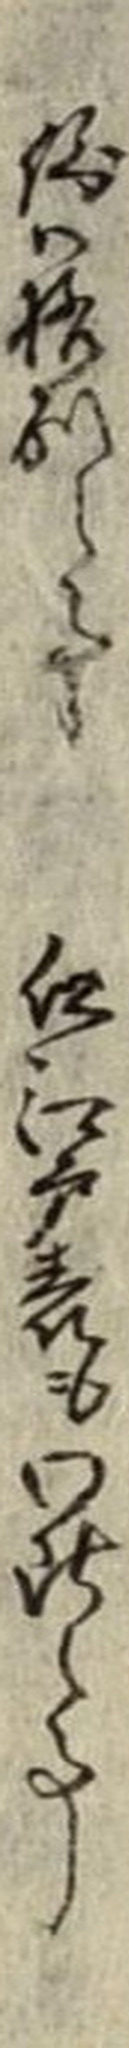儀は格別之事但江戸表も同断之事

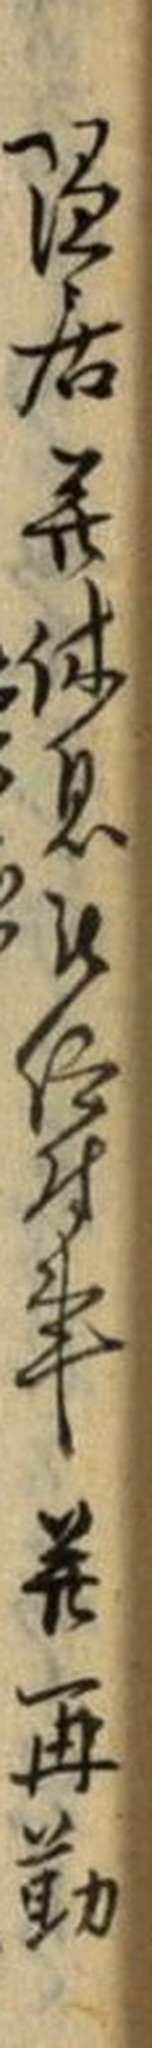隠居并休息被仰付事并再勤
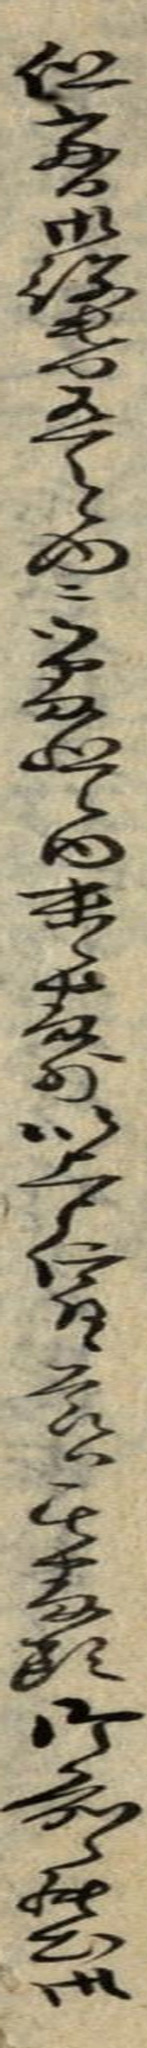但当日御役替有之候内に御番組之内未之番外以上被仰付候節は其番頭御前へ罷出御
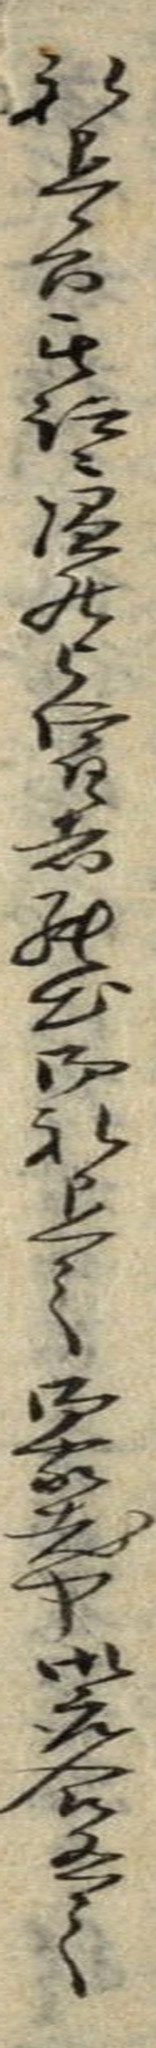礼申上候間其跡に隠居被仰付候者罷出御礼申上之御家老中御取合有之
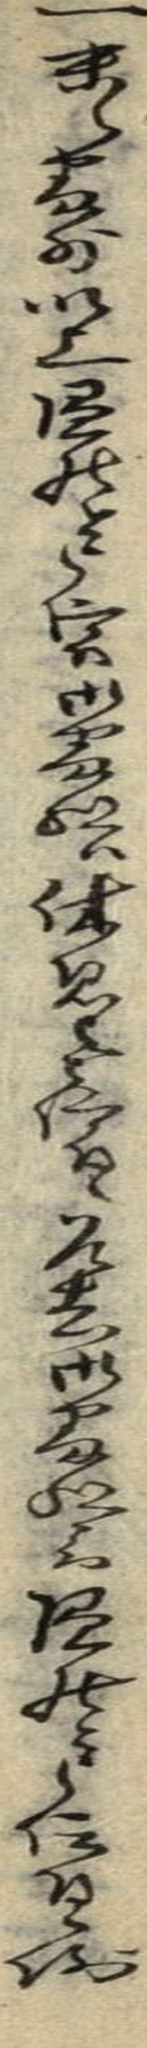一未之番外以上隠居と被仰付御番組は休息与被仰付候乍去御番組に而隠居と被仰付候例
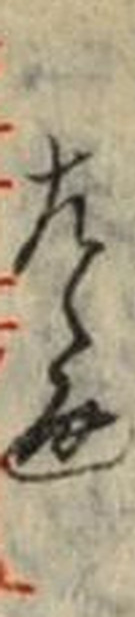左之通
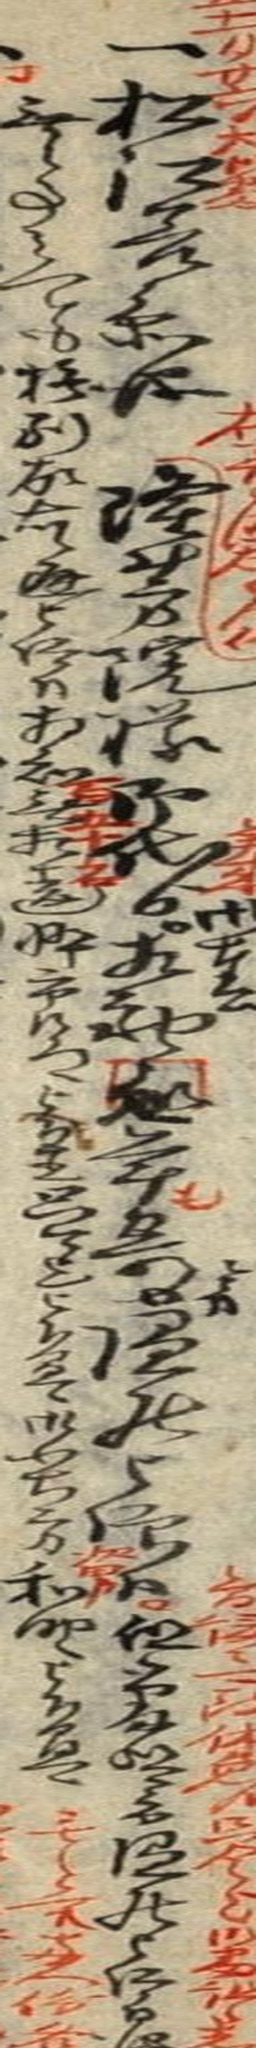無之事に候へとも格別故右之通被仰付拝知百五十石無相違忰市左衛門へ被下置只今迄被下置候御ふち方次男和助へ被下置候
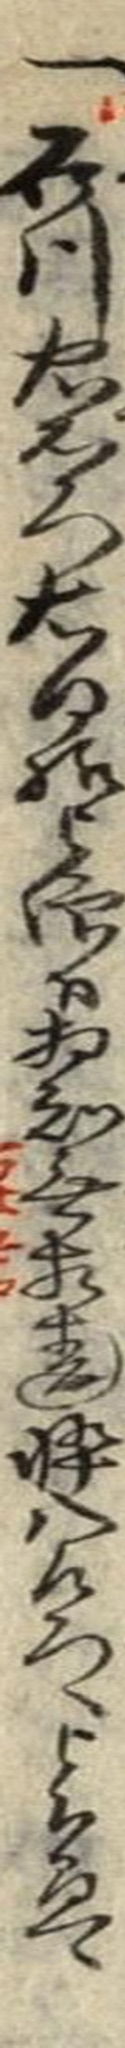一石川忠右衛門右同様被仰付拝知百廿五石無相違忰八左衛門へ被下置候
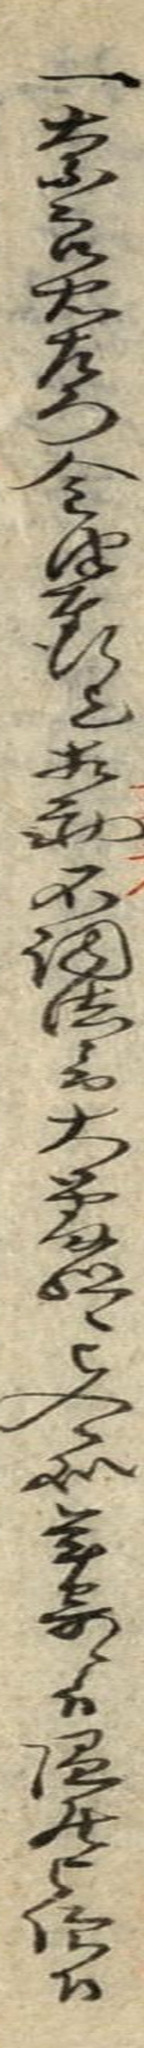一奈良忠左衛門金津奉行迄相勤不調法に而大番組へ被入候処年寄に付隠居被仰付
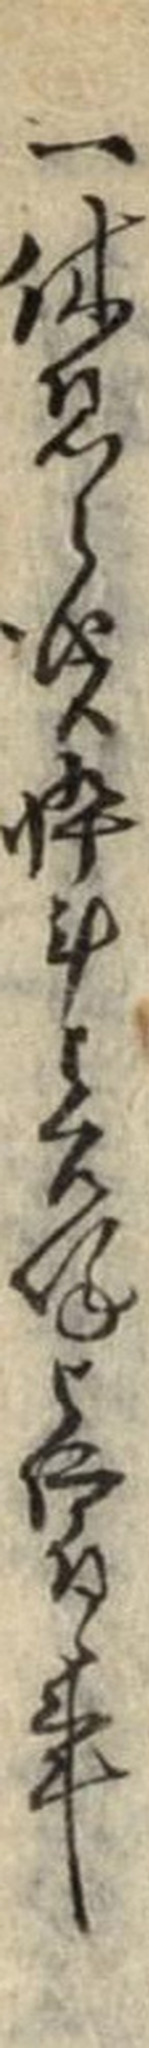一休息之儀は忰斗被召呼被仰付候事
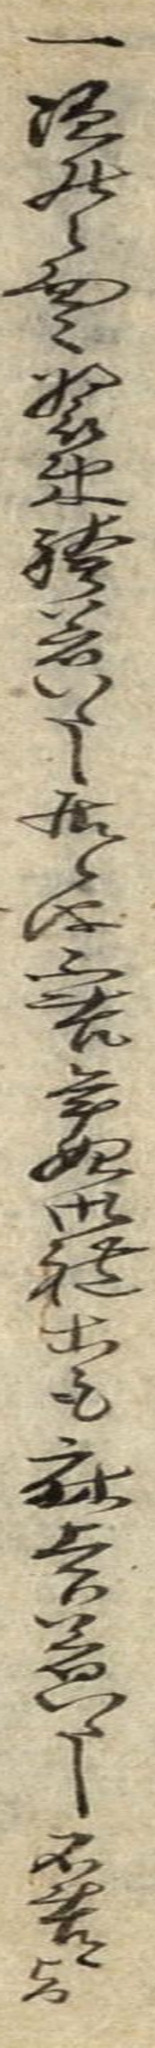一隠居之面々装束袴着いたし居候儀不苦年始御礼等にも麻上下着いたし不苦候旨
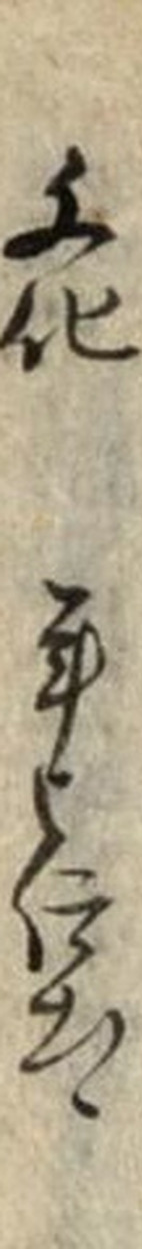文化年被仰出候
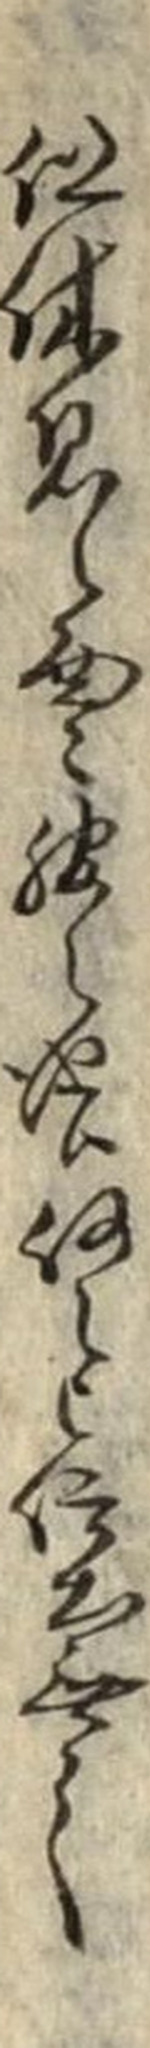但休息之面々服之儀は何之被仰出無之
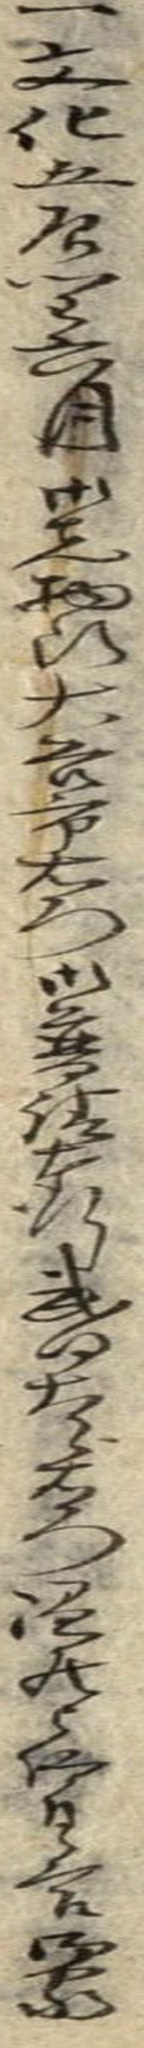一文化五辰閏六月御先物頭大谷市右衛門御普請奉行武田太郎右衛門隠居被仰付候節御家
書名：御用并被仰出之部
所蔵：福井県文書館 Fukui Prefectural Archives
